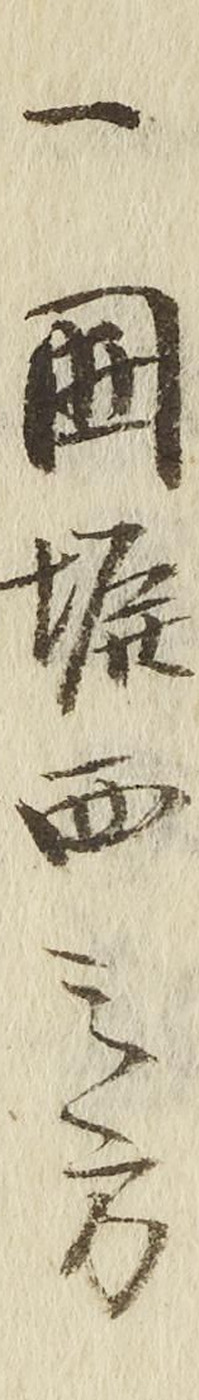一囲塀西之方倒
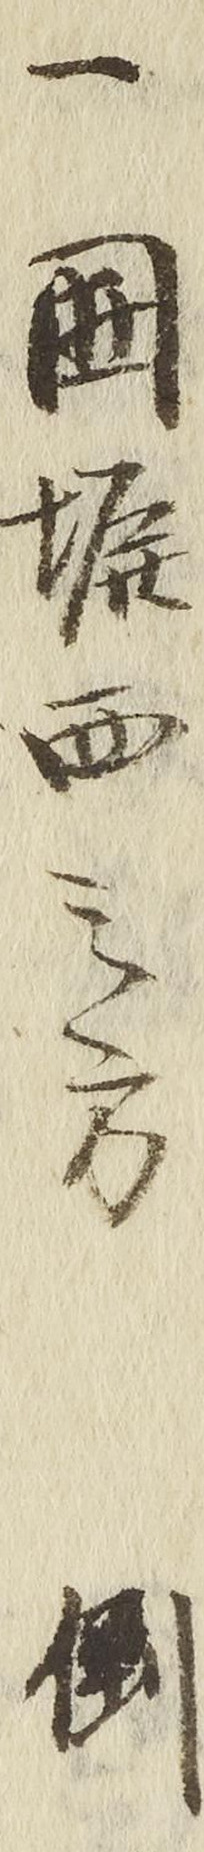一囲塀西之方倒
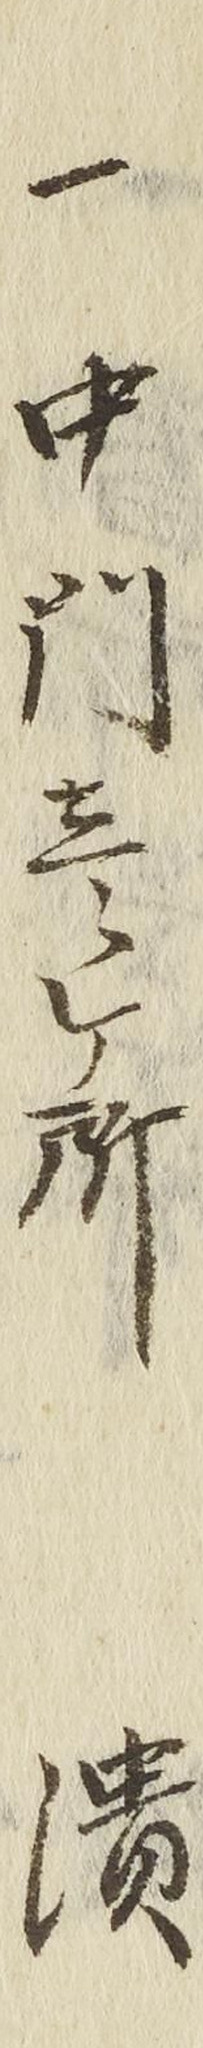一中門壱ヶ所潰
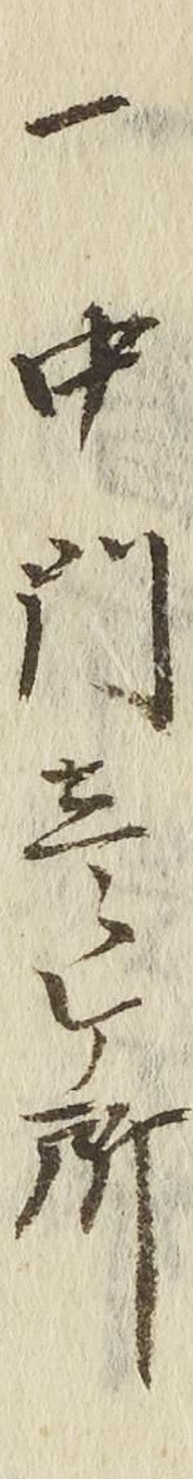一中門壱ヶ所潰
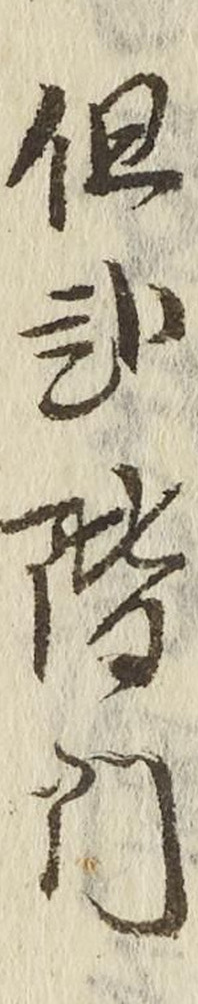但弐階門
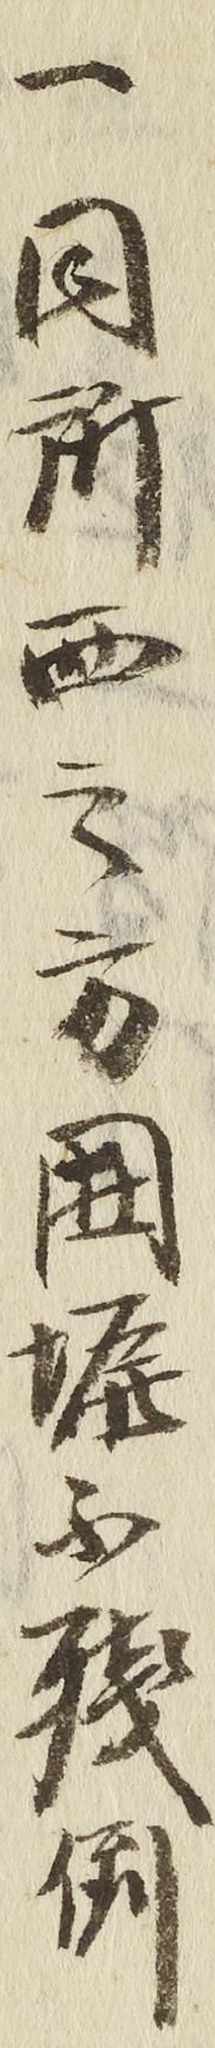一同所西之方囲塀不残倒
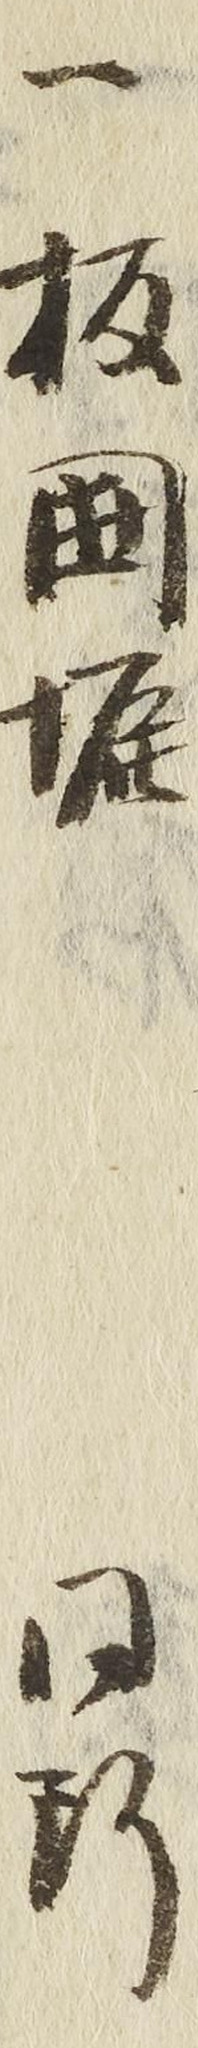一板囲塀同断
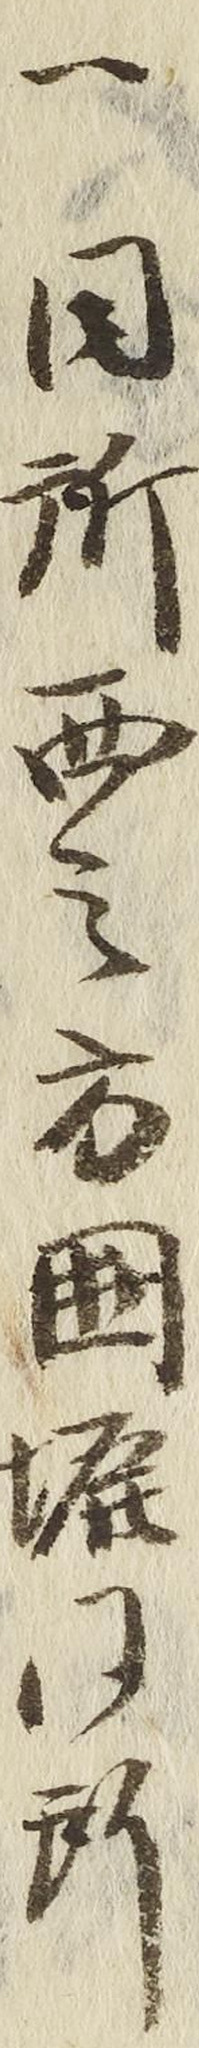一同所西之方囲塀同断
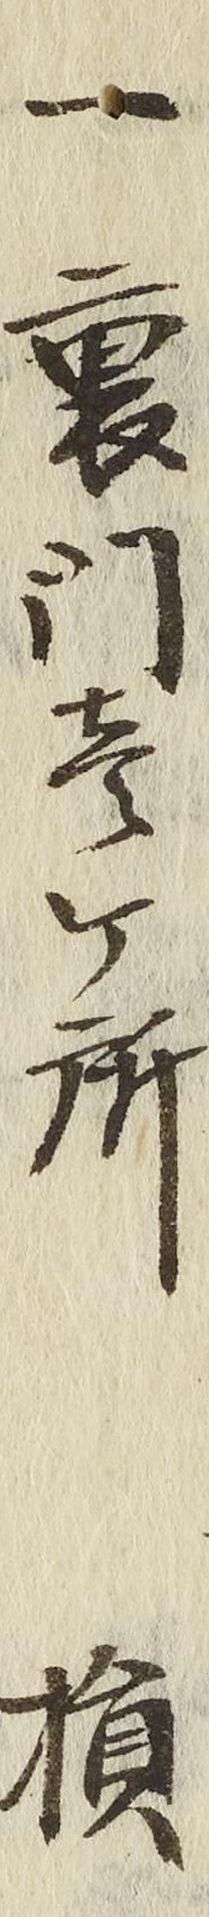一裏門壱ヶ所損
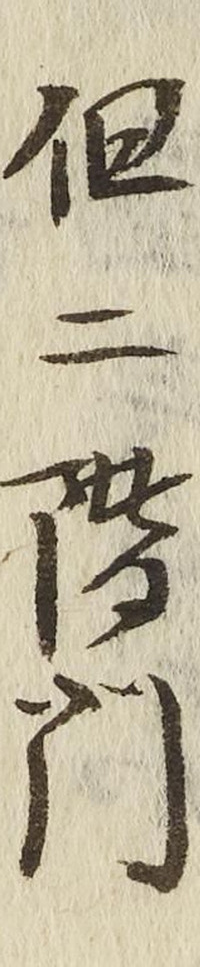但二階門
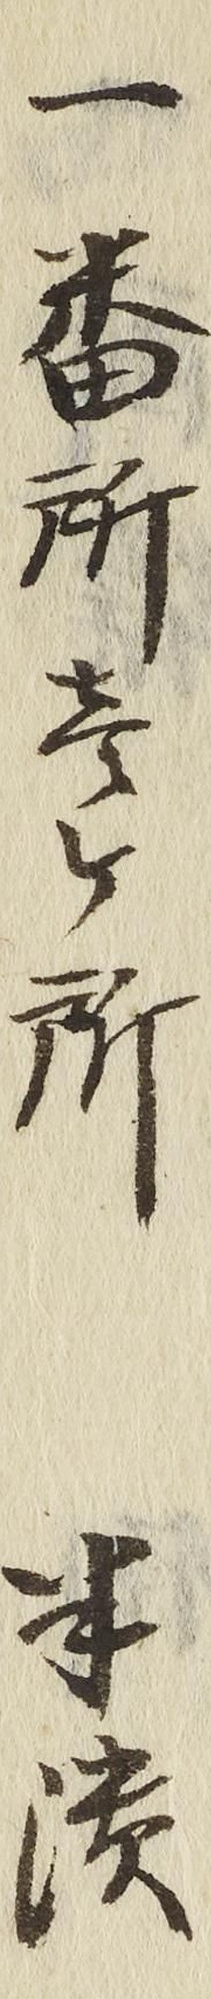一番所壱ヶ所半潰
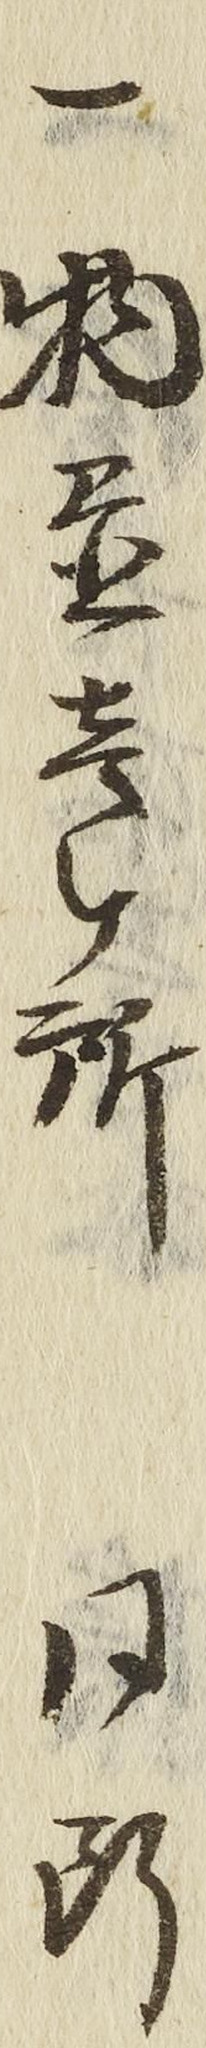一物置壱ヶ所同断
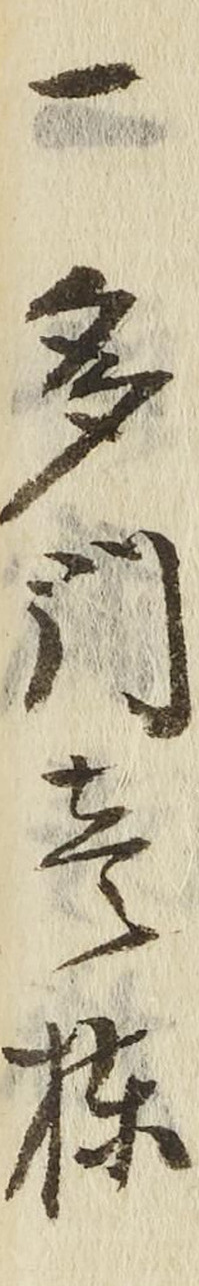一多門壱棟潰
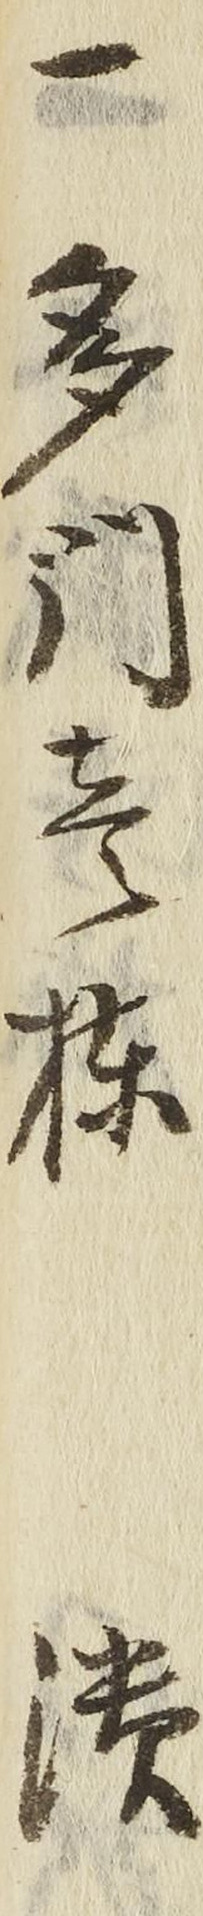一多門壱棟潰
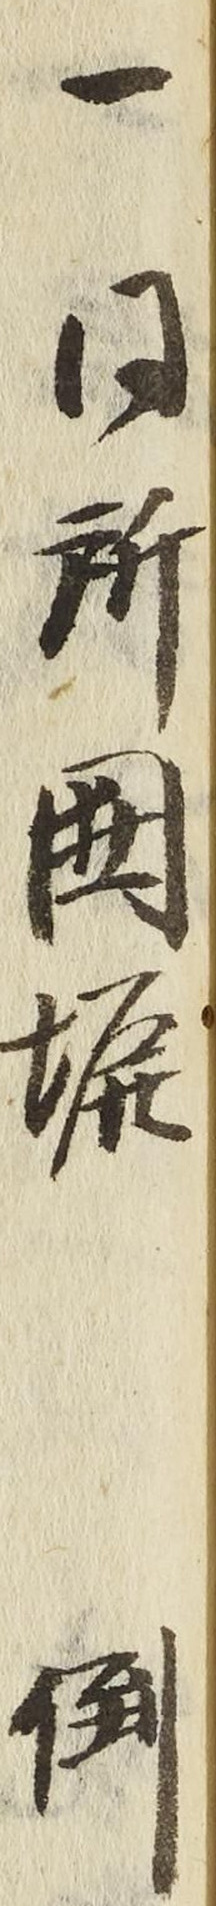一同所囲塀倒
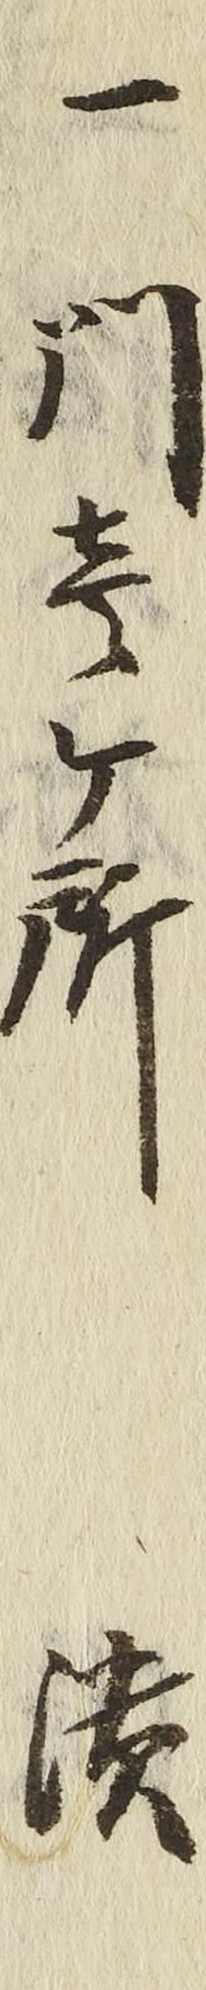一門壱ヶ所潰
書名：信濃國大地震記　乾
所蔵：東京大学地震研究所図書室 Earthquake Research Institute Library, The University of Tokyo, JAPAN
